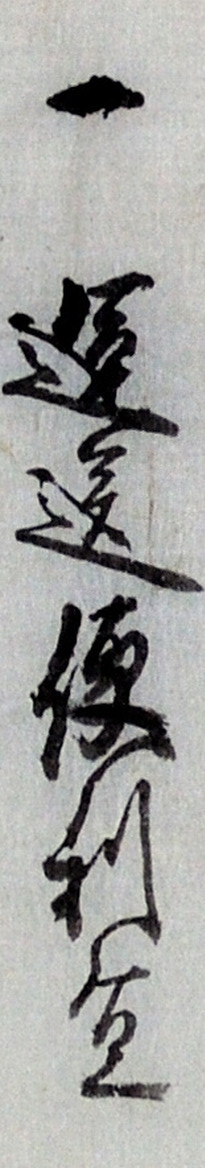一運送便利宜
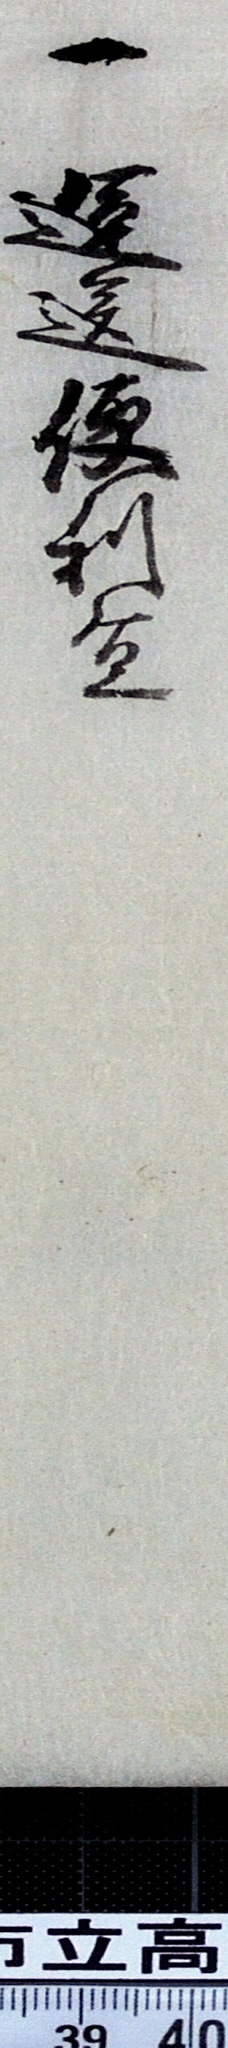一運送便利宜

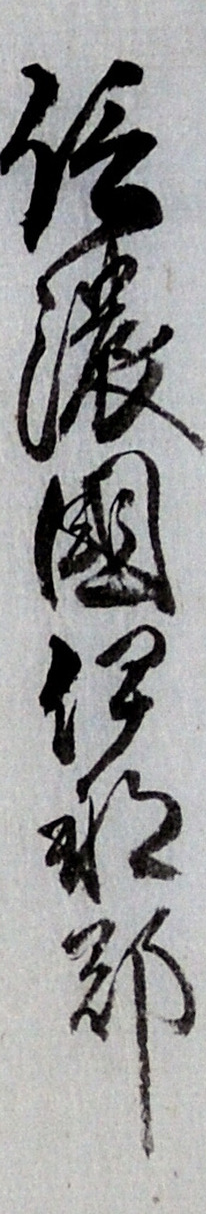信濃国伊那郡
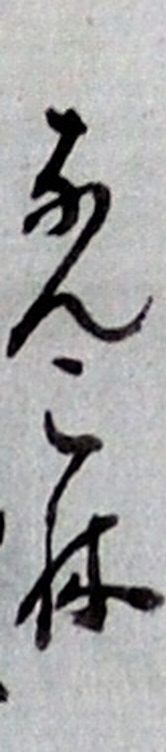なんこ林
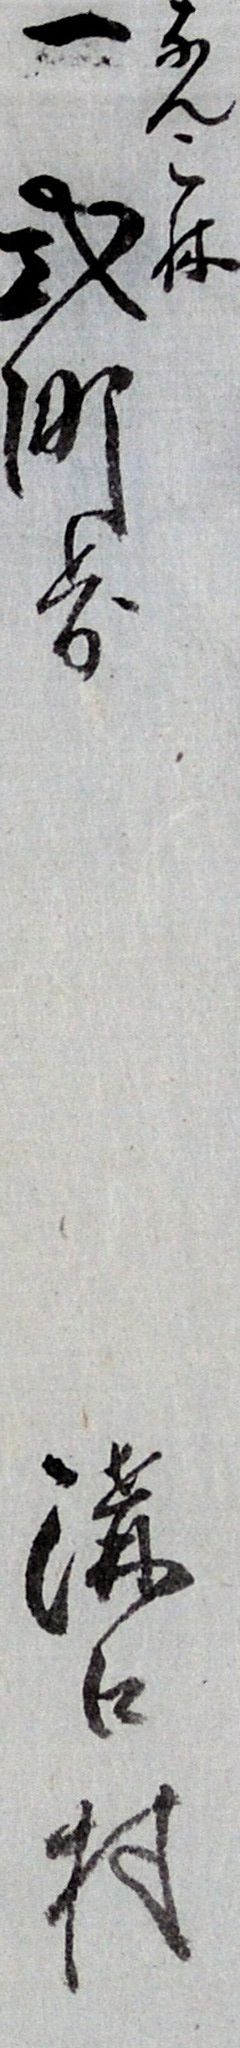一弐町歩溝口村
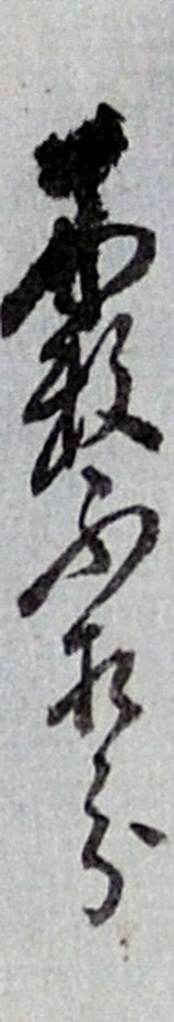木数不相分
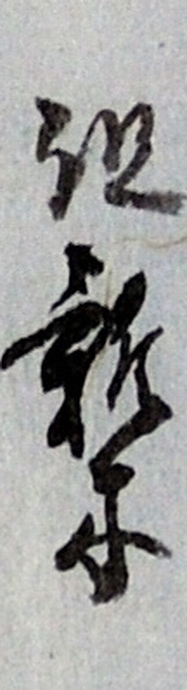但雑木
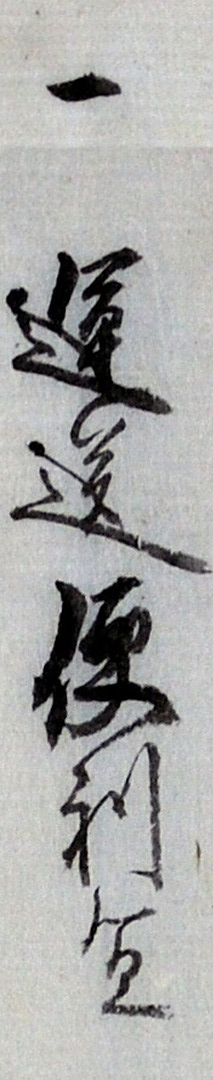一運送便利宜
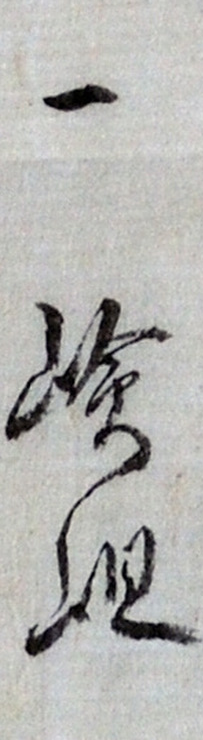一嶮岨
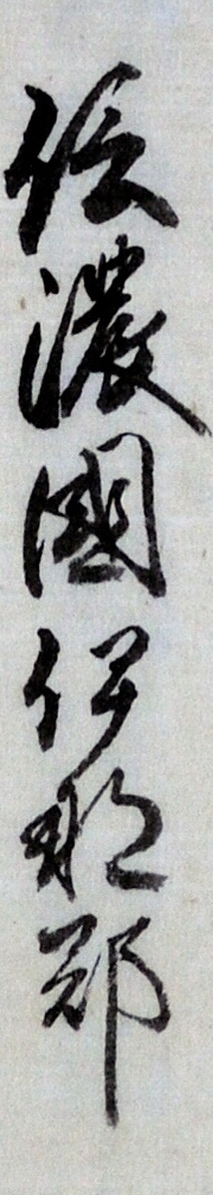信濃国伊那郡
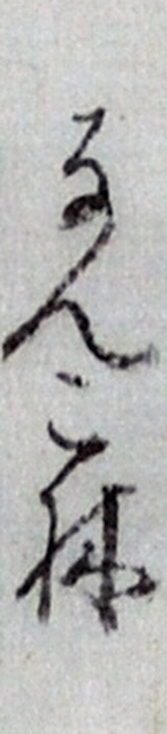なんこ林
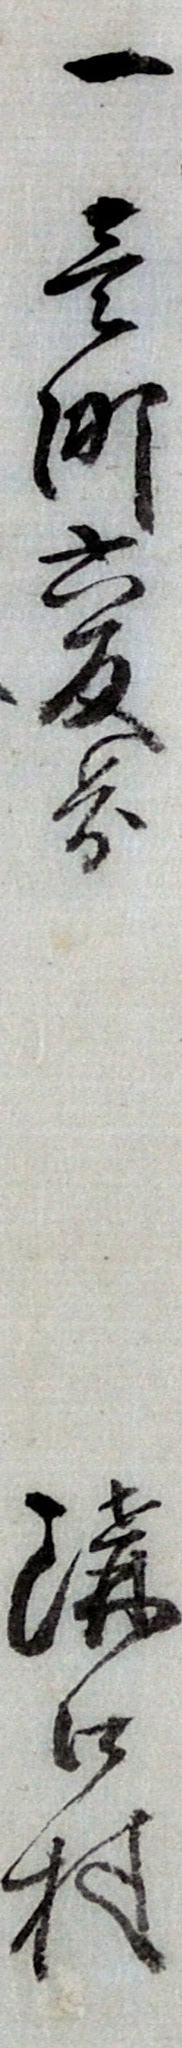一壱町六反歩溝口村
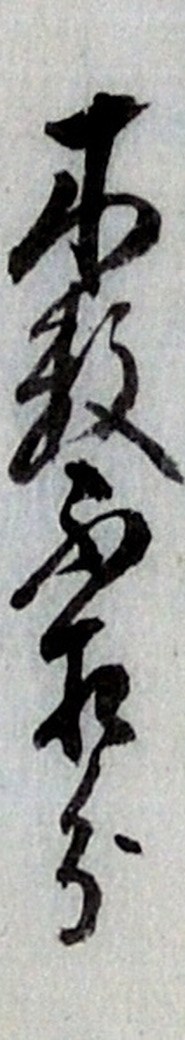木数不相分
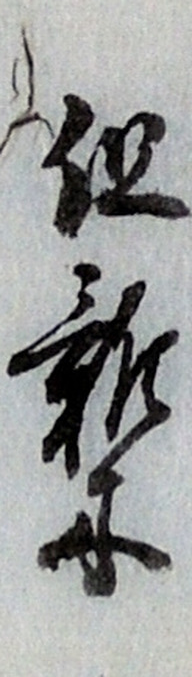但雑木
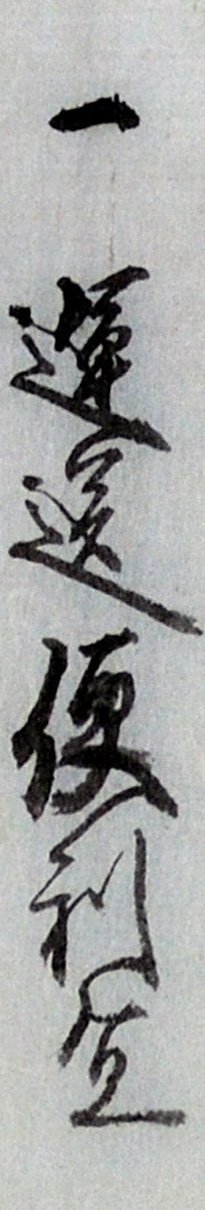一運送便利宜
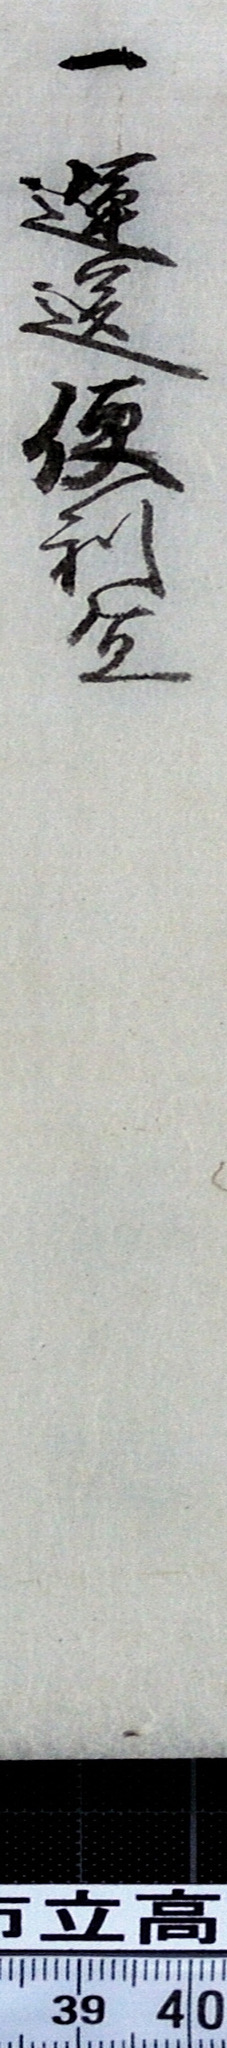一運送便利宜
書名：官林反別帳
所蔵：伊那市立高遠町図書館・合同会社AMANE
